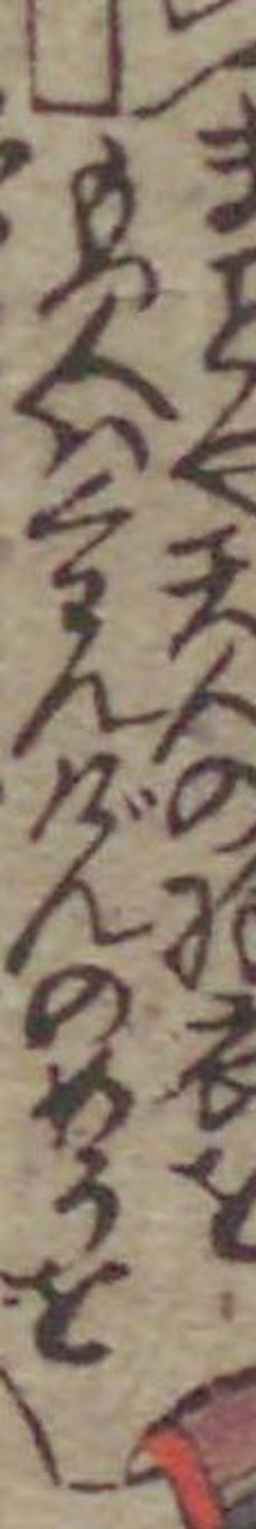もつ人はくわんげんのめうを
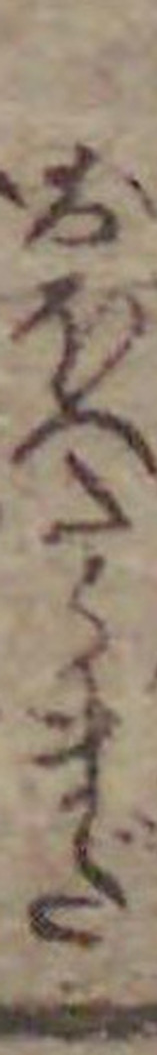おぼへたらまだ
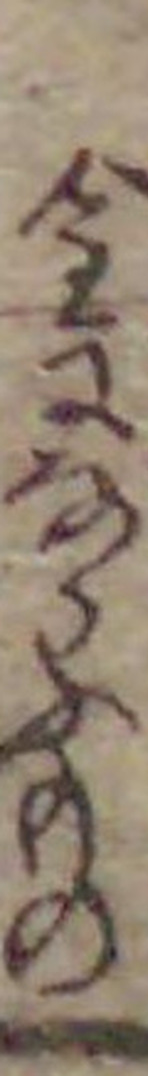金にならふもの
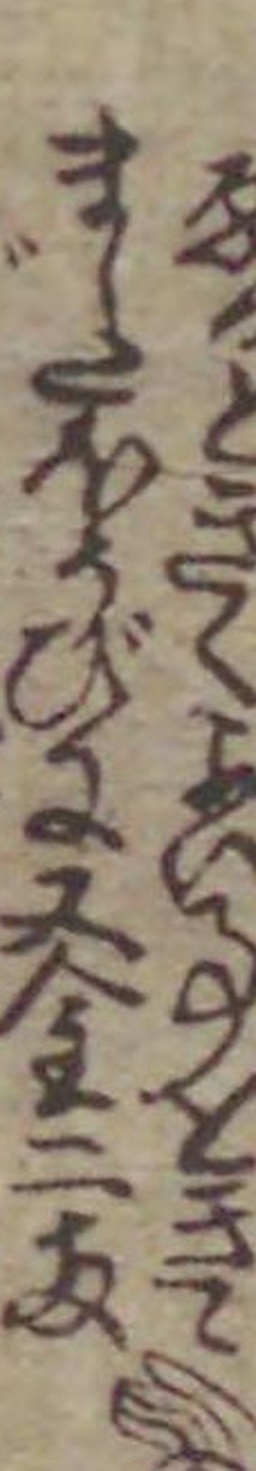ましたほうびに又金二両
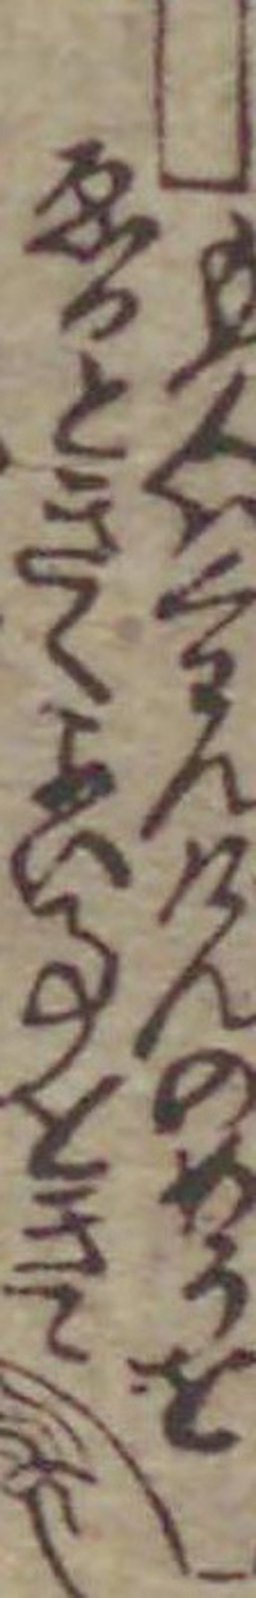ゑるときくよい事をきゝ
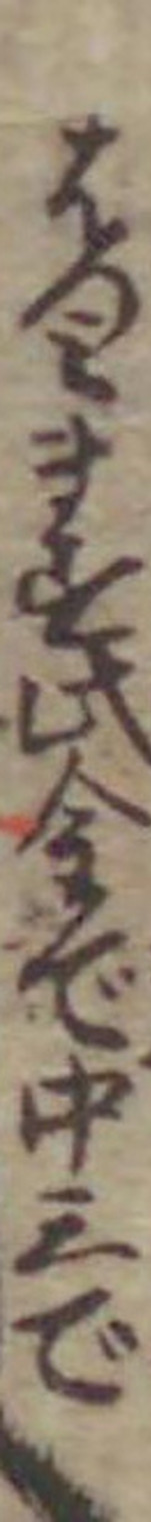はづみます此金で中三で
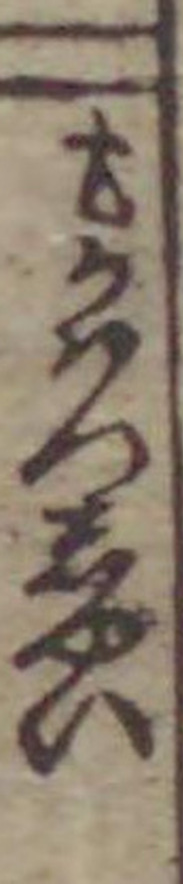もかはつしやい
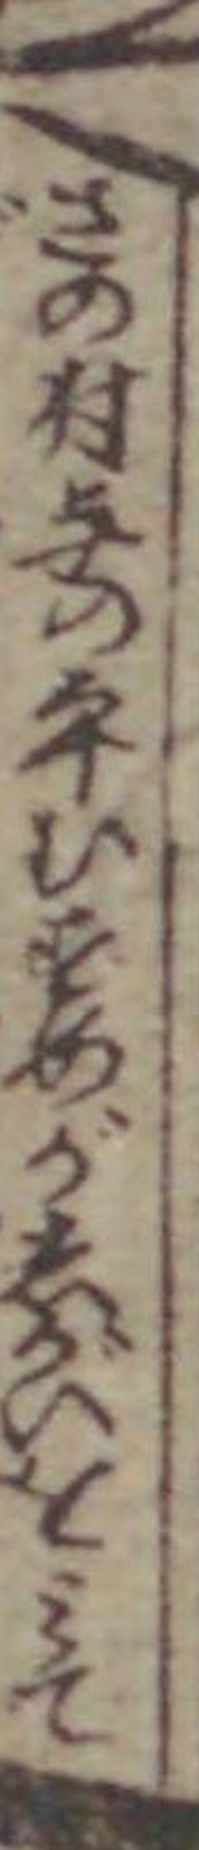さの村与の平むすめがしがいをみて
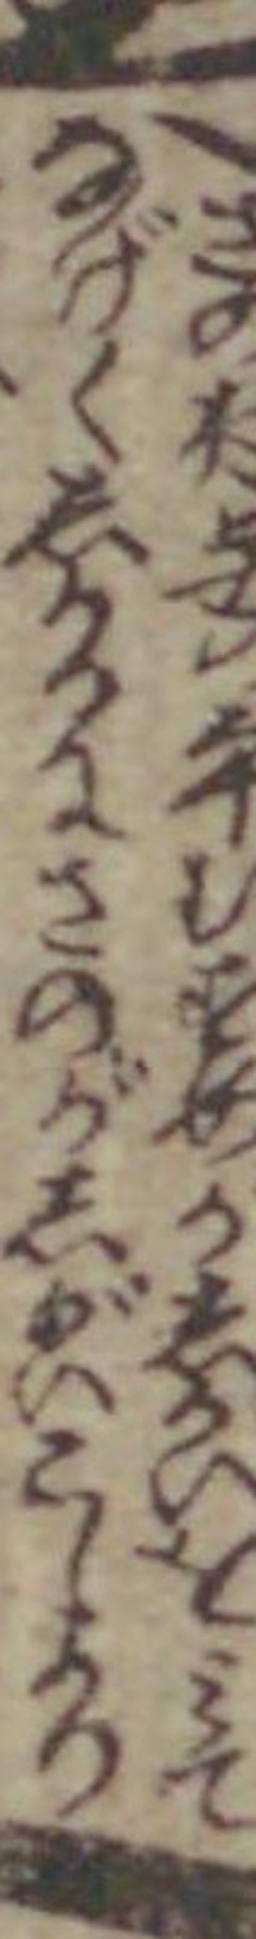なげくしかるにさのがしがいこしより
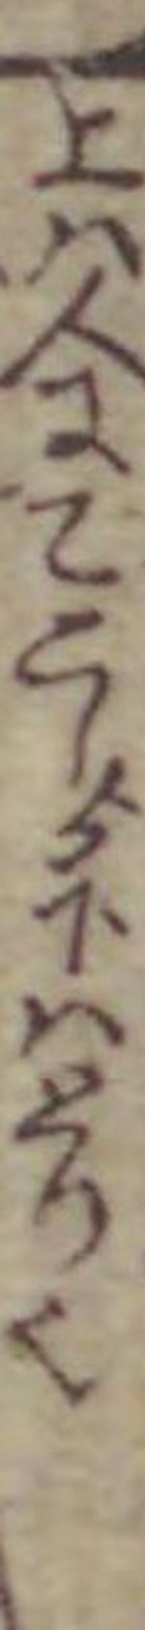上は人にてこしより下はとり也
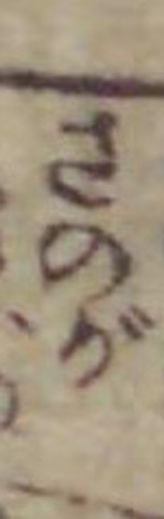さのが
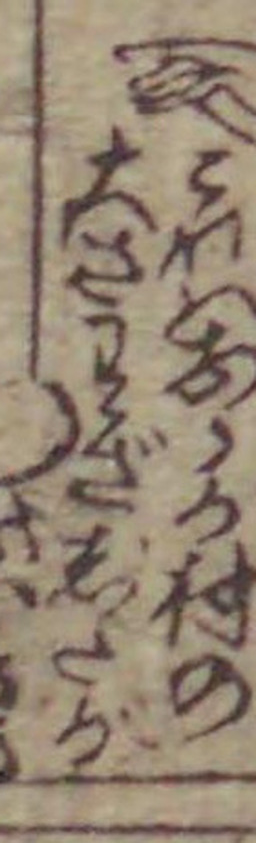大さわぎしたが
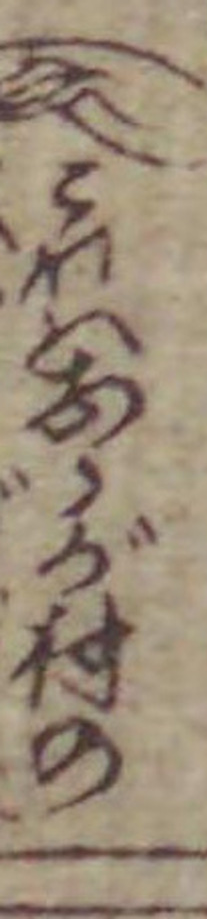これはおらが村の
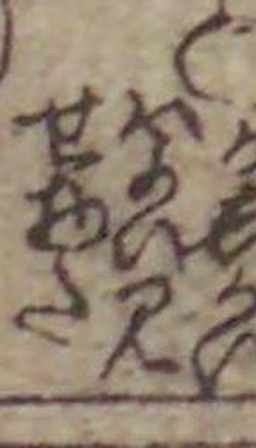せ物た
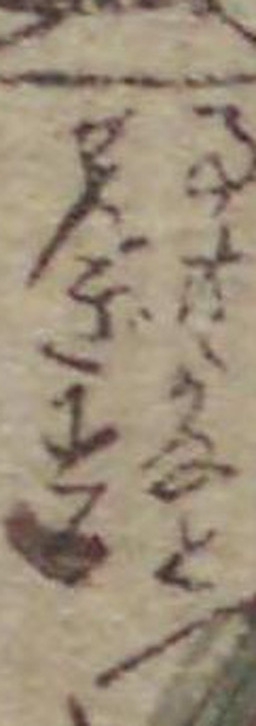せんぎする
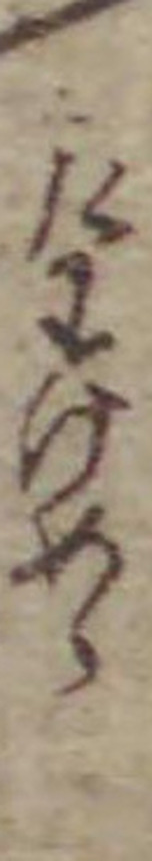たわけめら
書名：娜二代鉢木 5巻
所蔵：国立国会図書館 National Diet Library, JAPAN
